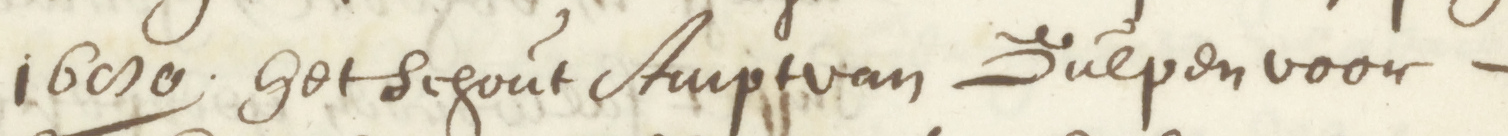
1680 het schout Ampt van Gulpen voor-
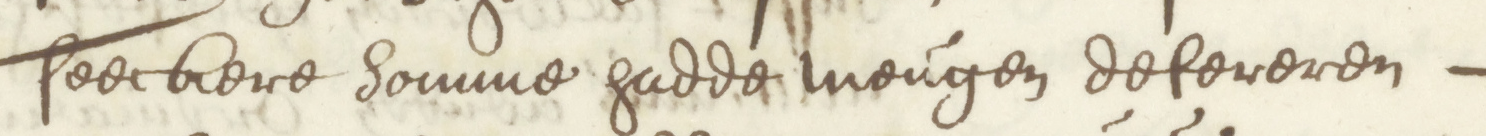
seeckere somme hadde meugen defereren -
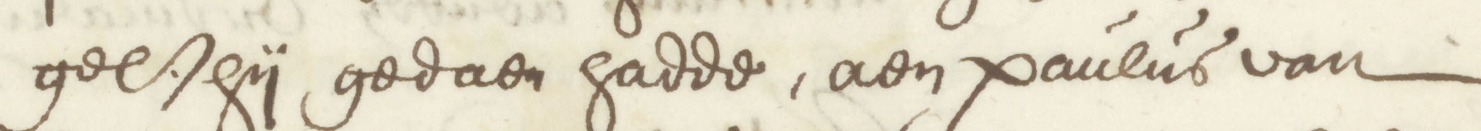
gel hij gedaen hadde, aen paulus van
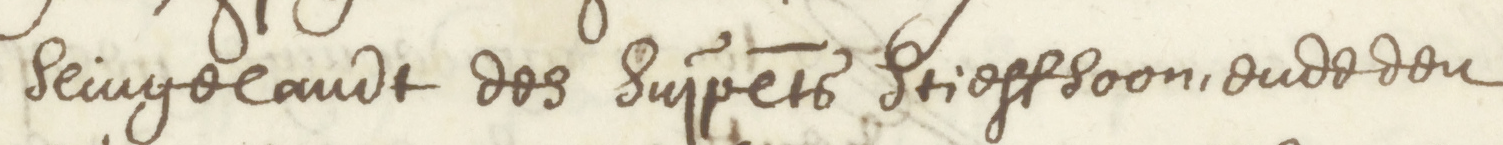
slingelandt des Supplts Stieffsoon, ende den
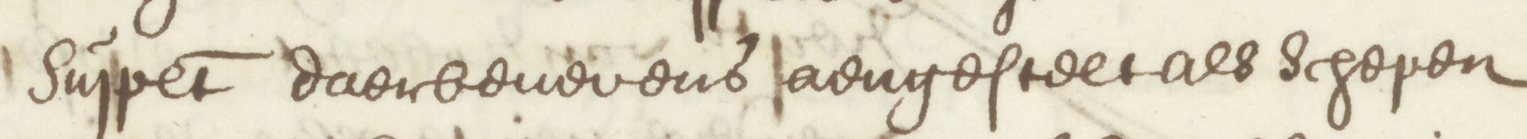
Supplt daerbenevens aengestelt als schepen
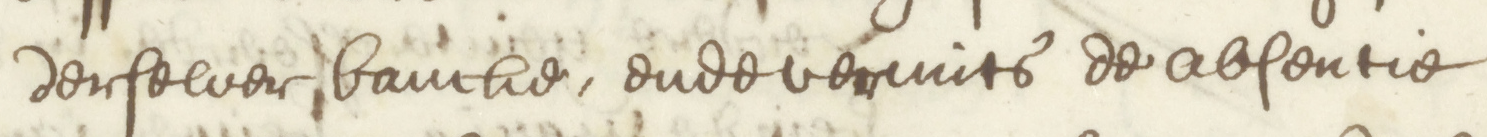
derselver bancke, ende vermits de absentie
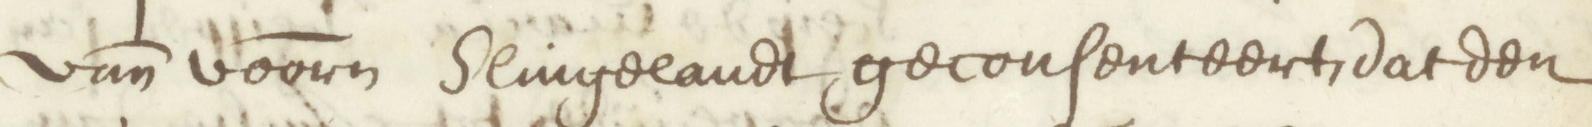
van voorn Slingelandt, geconsenteert, dat den
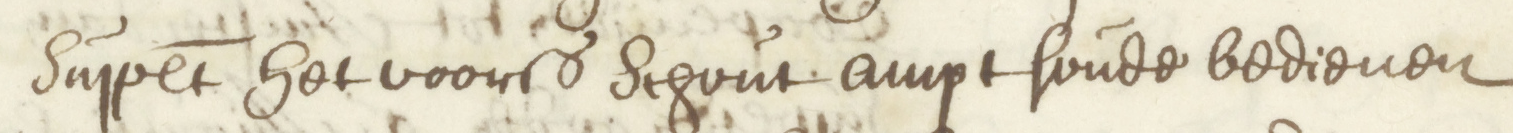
Supplt het voorsz schout ampt soude bedienen
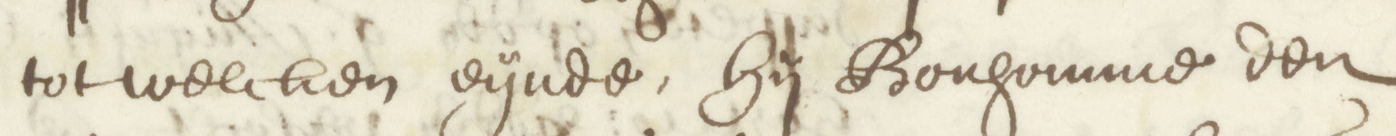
tot welcken eijnde, hij Bonhomme den
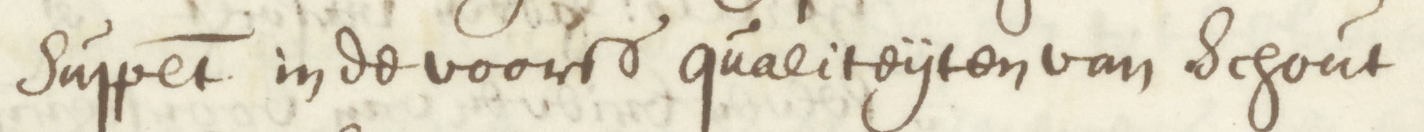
Supplt in de voorsz qualiteijten van Schout
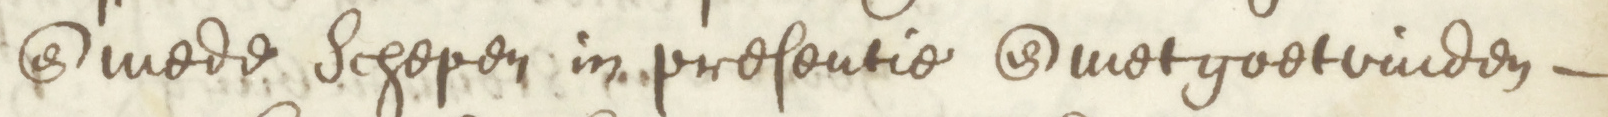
& mede Schepen, in presentie & met goetvinden -
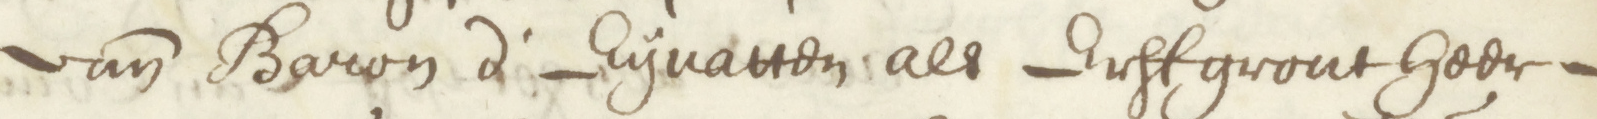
van Baron d'Eijnatten, als Erffgront heer
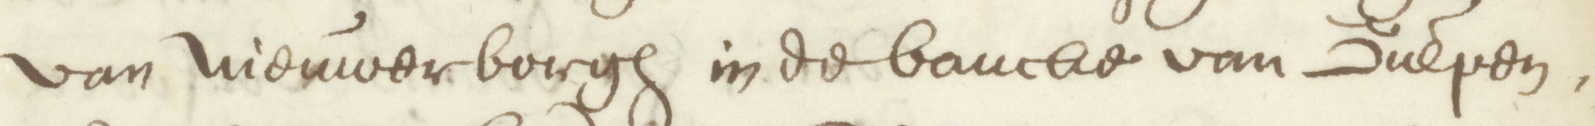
van niewerborgh in de bancke van Gulpen,
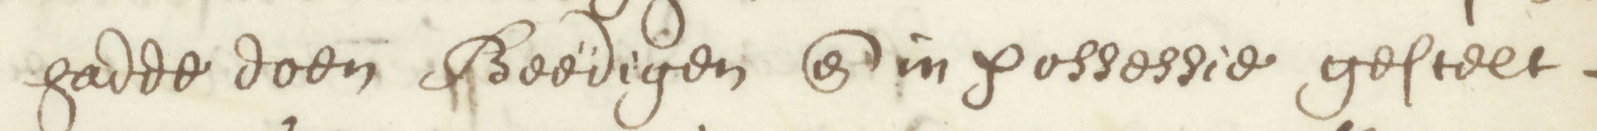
hadde doen Beedigen & in possessie gestelt
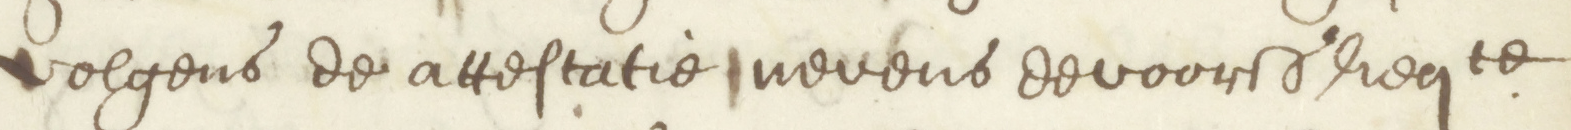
volgens de attestatie nevens de voorsz reqte.
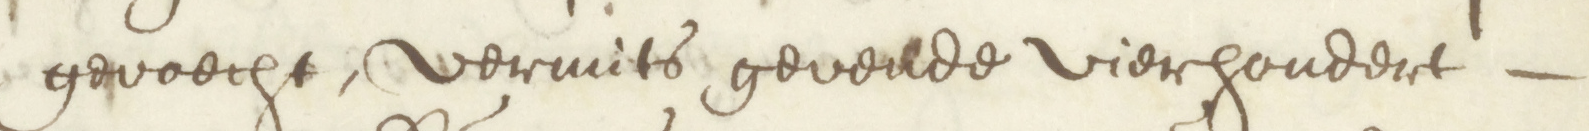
gevoecht, vermits gevende vierhondert —
